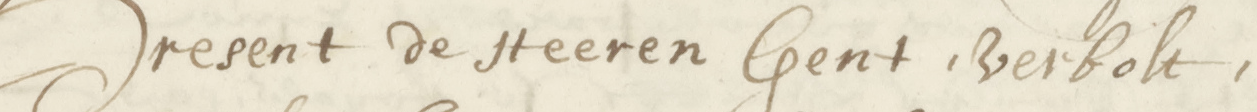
Present de Heeren Gent, Verbolt,
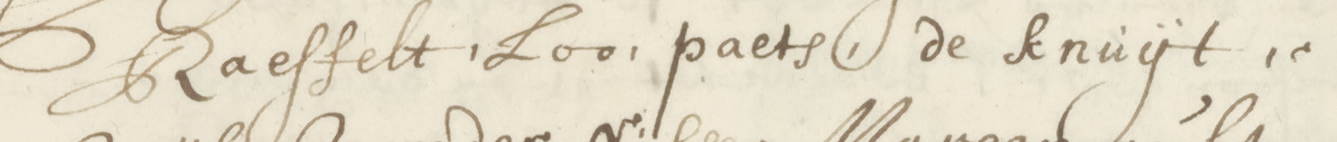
Raesfelt, Loo, paets, de Knuijt,
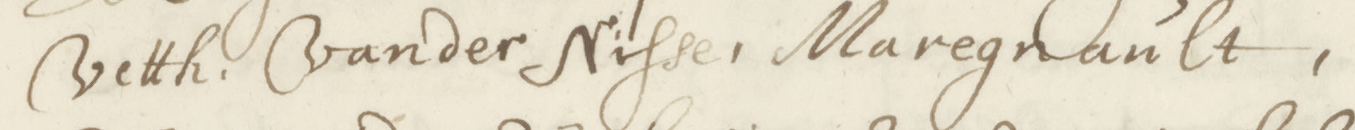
Vetth. Van der Nisse, Maregnault,
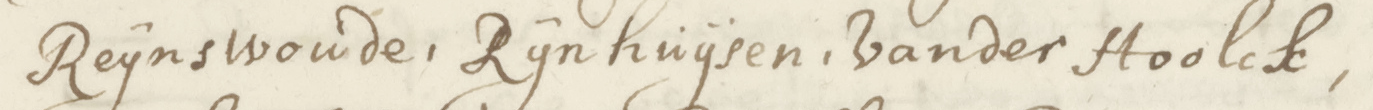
Reijnswoude, Rijnhuijsen, vander Hoolck,
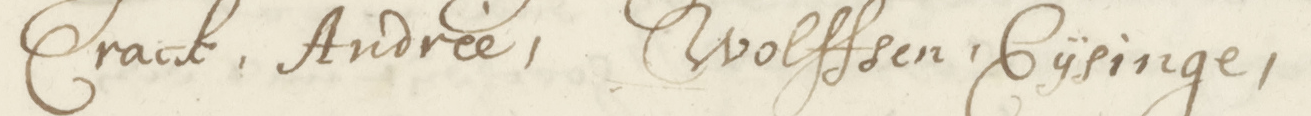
Crack, Andreè, Wolffsen, Eijsinge.
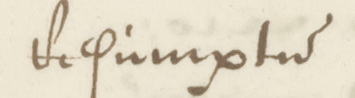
Resumptie
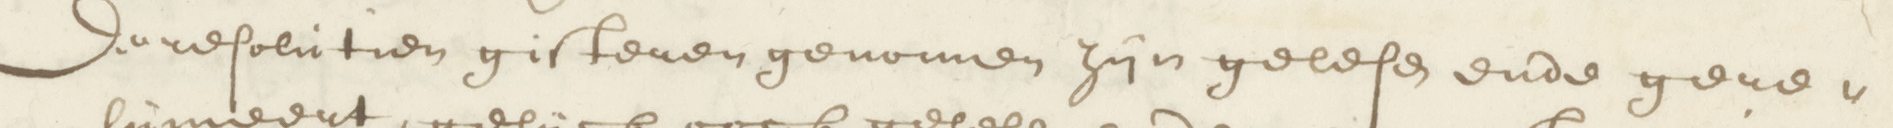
De resolutien gisteren genomen zijn gelesen ende gere„
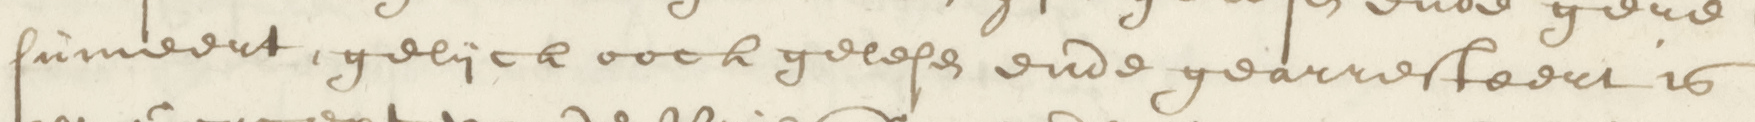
sumeert, gelijck oock gelesen ende gearresteert is
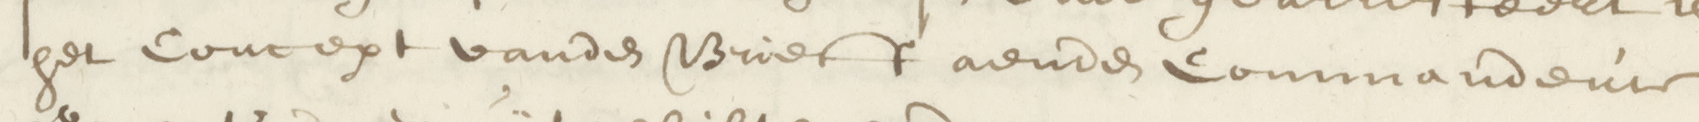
het Concept vanden Brieff aenden Commandeur
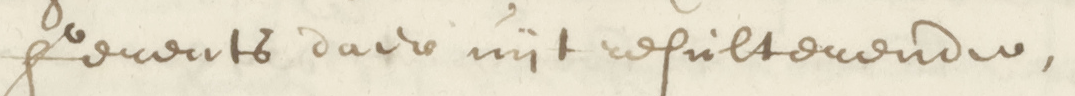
Ferents daer uijt resulterende.
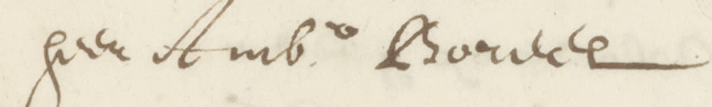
heer Ambr. Boreel
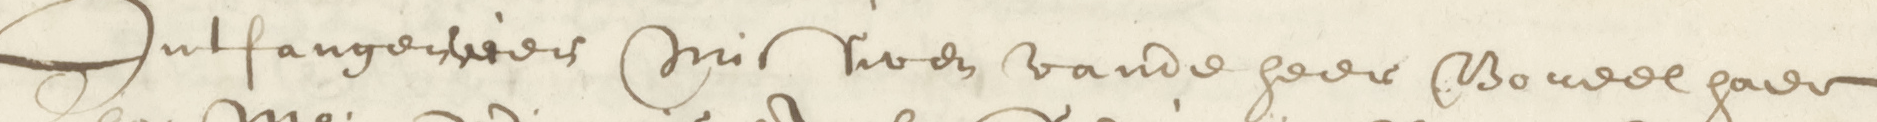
Ontfangen een Missiven vande heer Boreel haer
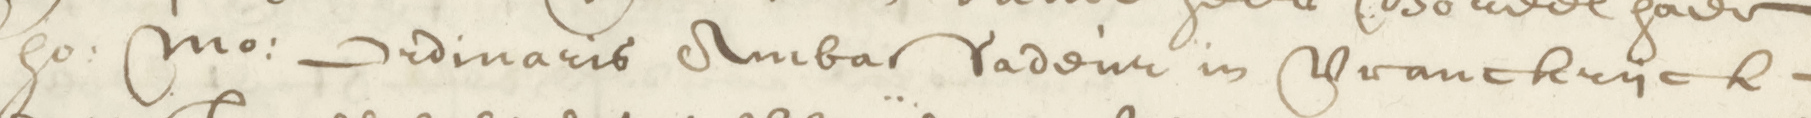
ho:Mo: Ordinaris Ambassadeur in Vranckrijck
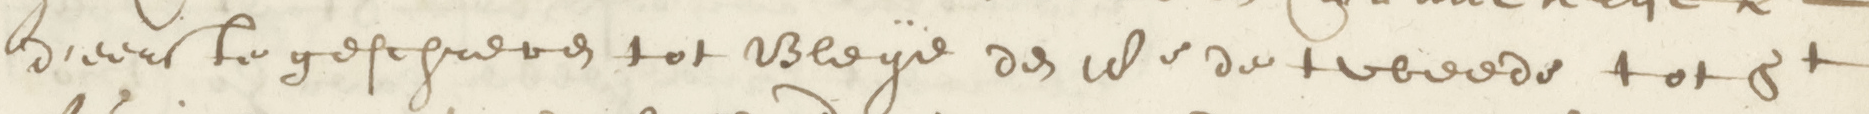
d‛eerste geschreven tot Bleije den 18e de tweede tot St
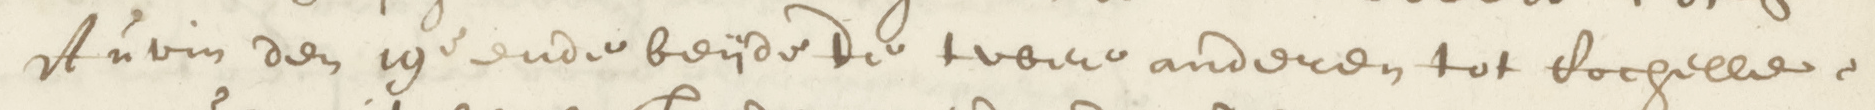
Auvin den 19e ende beijde de twee anderen tot Rochelle,
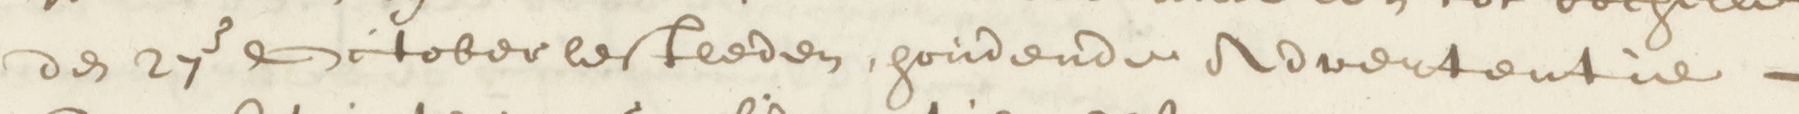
den 27e October lestleden, houdende Advertentie -
